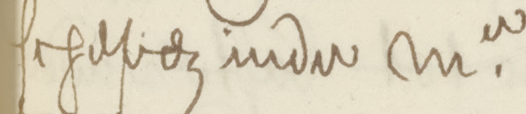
schepen inde Me
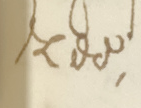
zee
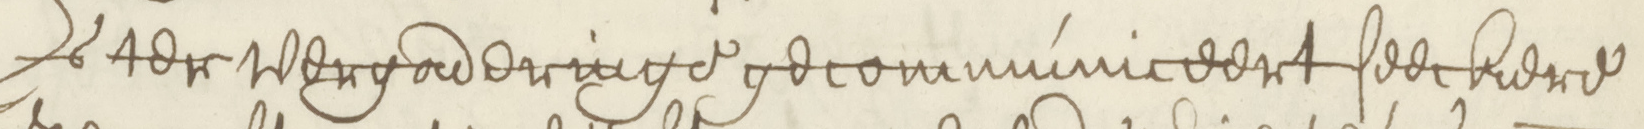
Is ter vergaderinge gecommuniceert seeckere
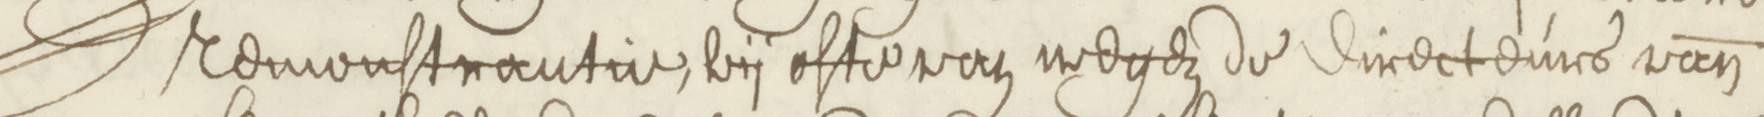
remonstrantie, bij ofte van wegen de directeurs van
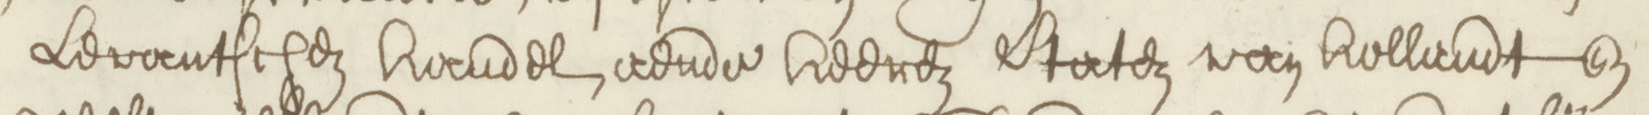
Levantschen handel, aende heeren Staten van hollandt ende
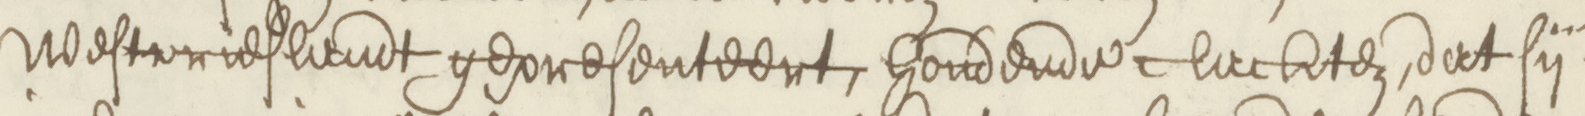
Westvrieslandt gepresenteert, houdende clachten, dat sij —
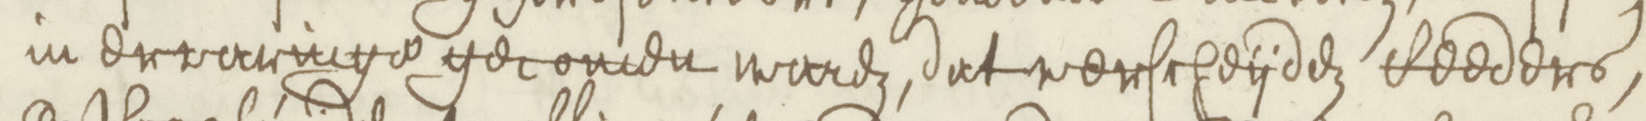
in ervaringe gecomen waren, dat verscheijden Reeders,
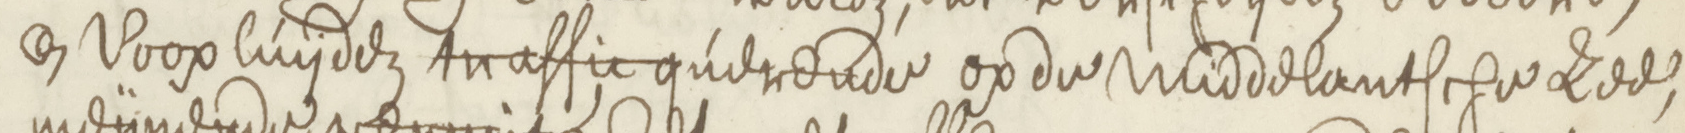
& Coopluijden trafficquerende op de Middelantsche Zee,
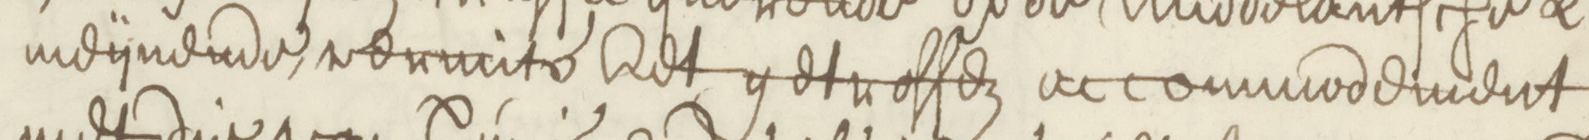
meijnende, vermits het getroffen accommodement
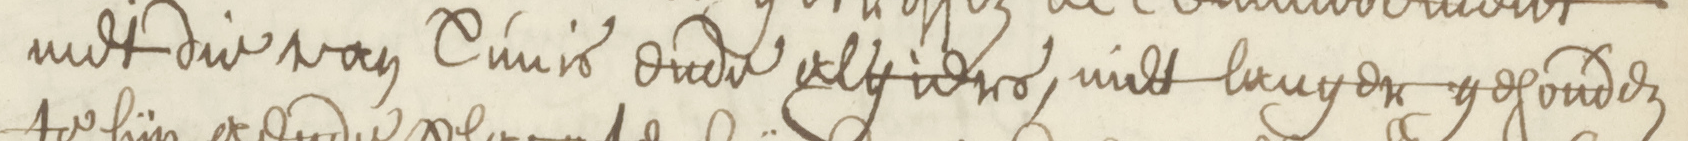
met die van Tunis ende algiers, niet langer gehouden
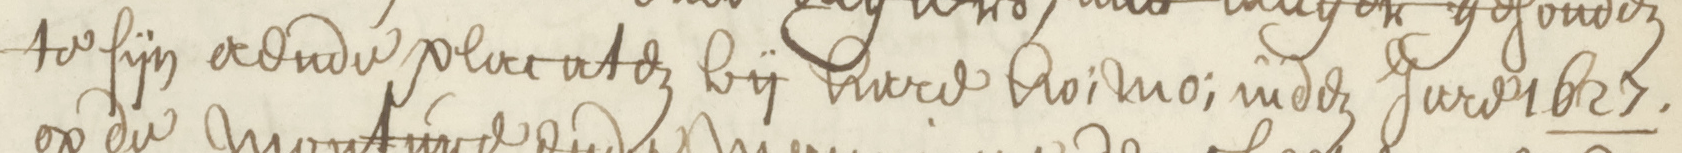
te sijn aende placaten bij hare Ho:Mo: inden jare 1627
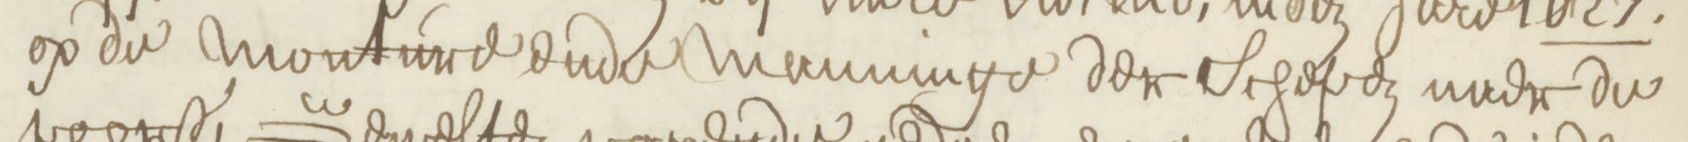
op de monture ende manninge der schepen naer de
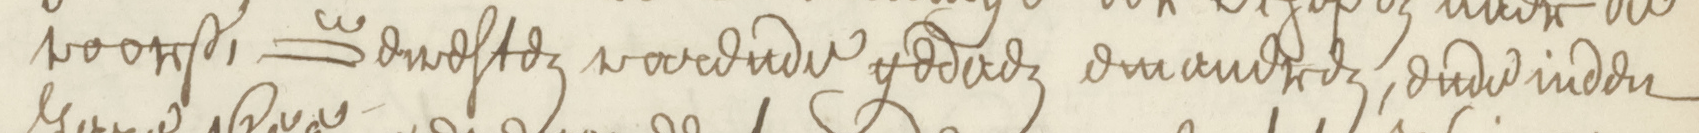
voors. Gewesten varende gedaen emaneren, ende inden
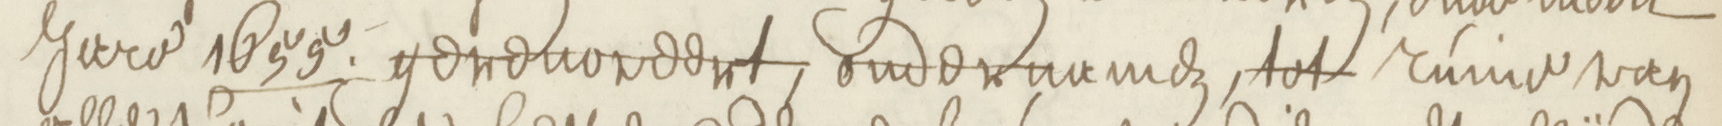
jaere 1655 gerenoveert, ondernamen, tot ruine van
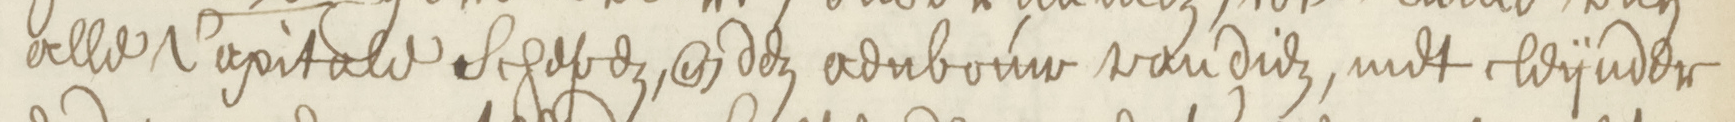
alle Capitale schepen, & den aenbouw van dien, met cleijnder
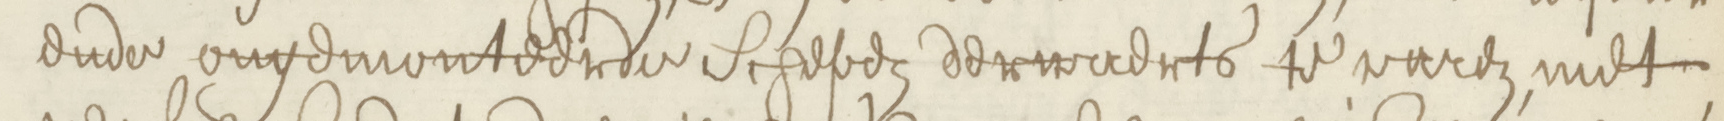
ende ongemonteerde schepen derwaerts te varen, met
